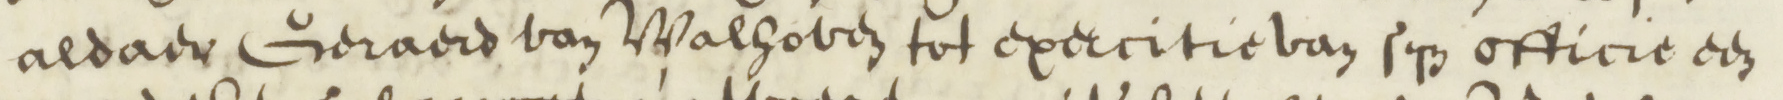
aldaer Geraerd van Walhoven tot exercitie van syn officie een
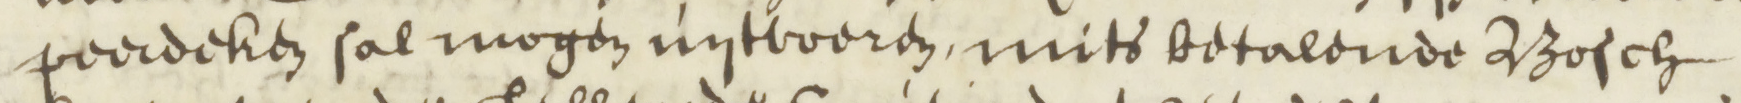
peerdeken sal mogen uytvoeren, mits betalende Bosch
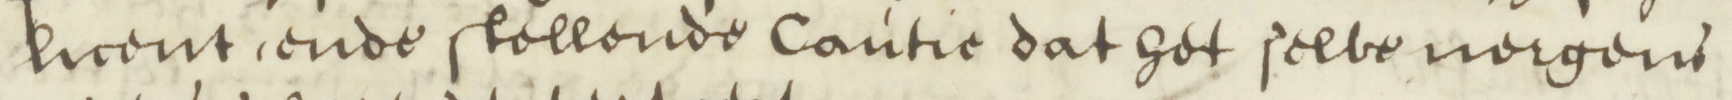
licent, ende stellende cautie dat het selve nergens
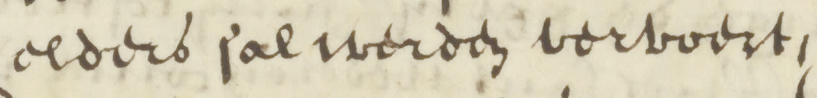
elders sal werden vervoert.
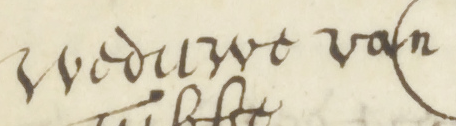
Weduwe van
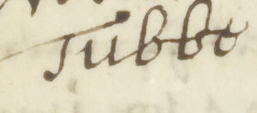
Tubbe
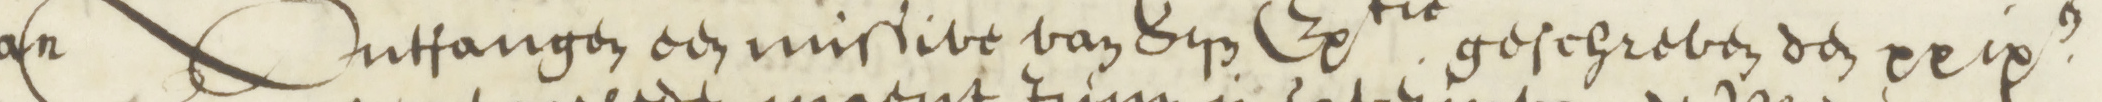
Ontfangen een missive van Syn Extie geschreven den xxixe
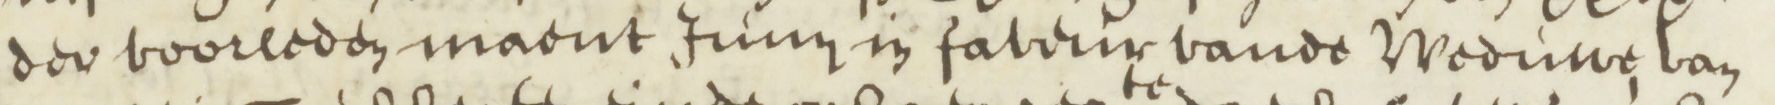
der voorleden maent Juny in faveur vande weduwe van
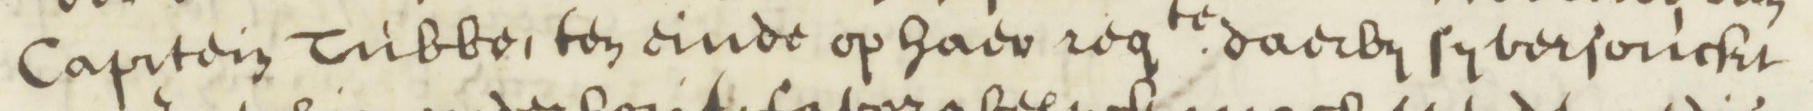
Capitein Tubbe, ten einde op haer reqte daerby sy versouckt
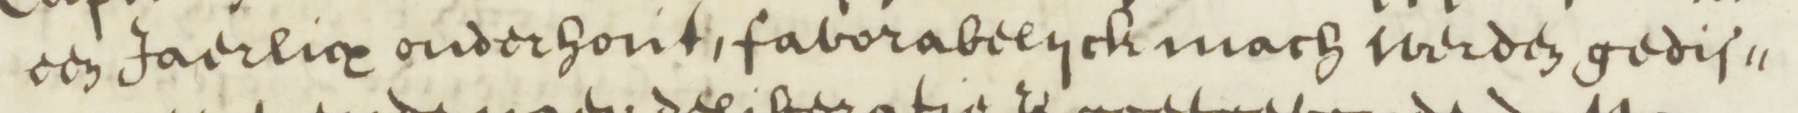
een jaerlicx onderhout, favorabelyck mach werden gedis„
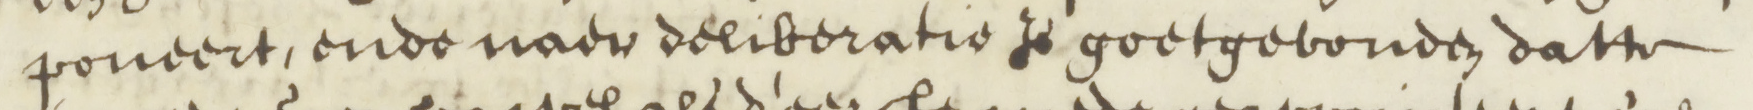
poneert, ende naer deliberatie is goetgevonden datte
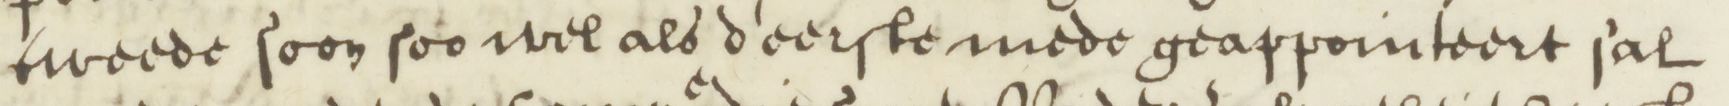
tweede soon soo wel als d'eerste mede geappointeert sal
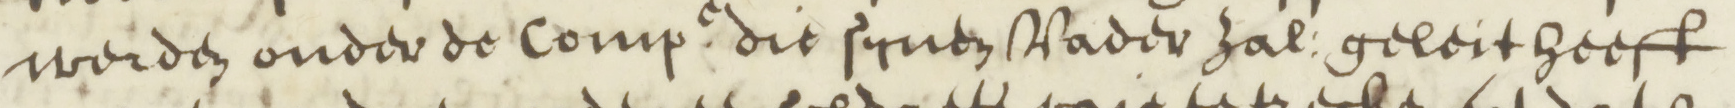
werden onder de Compe. die synen vader zal: geleit heeft
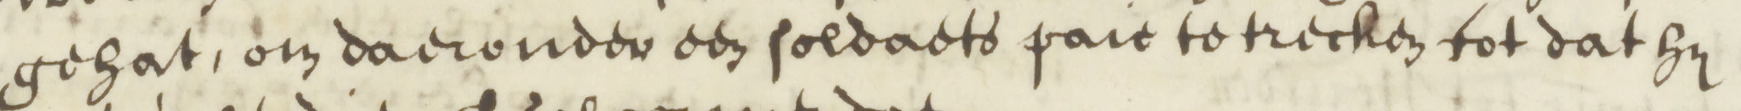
gehat, om daeronder een soldaets paie te trecken tot dat hy
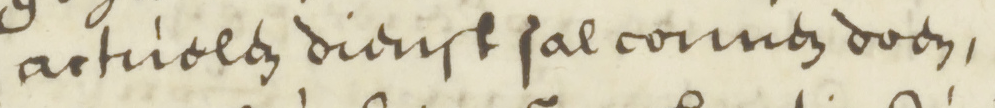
actuelen dienst sal connen doen.
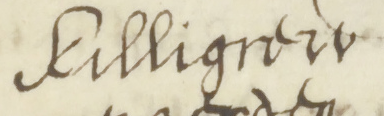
Killigrew
